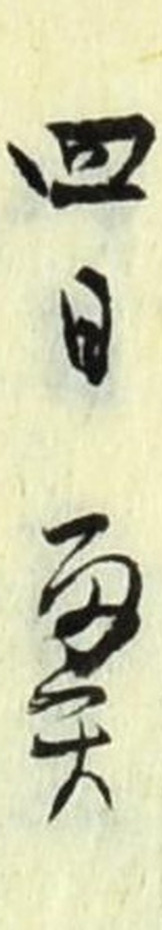四日雨天
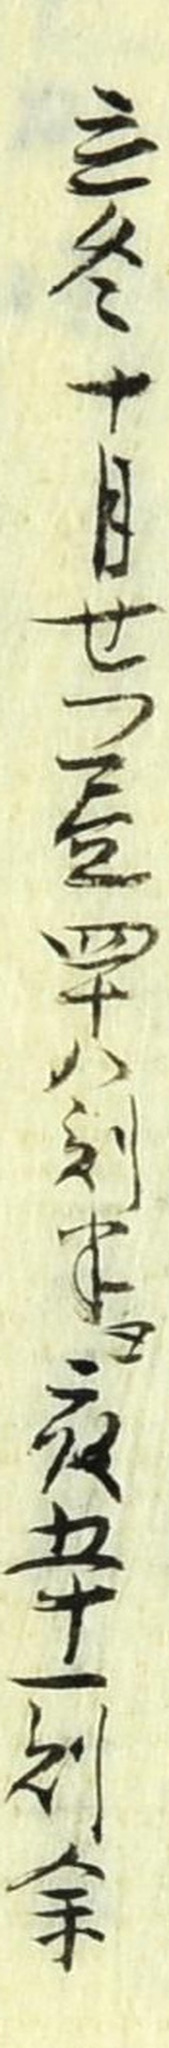立冬十月せつ昼四十八刻半ヨ夜五十一刻余
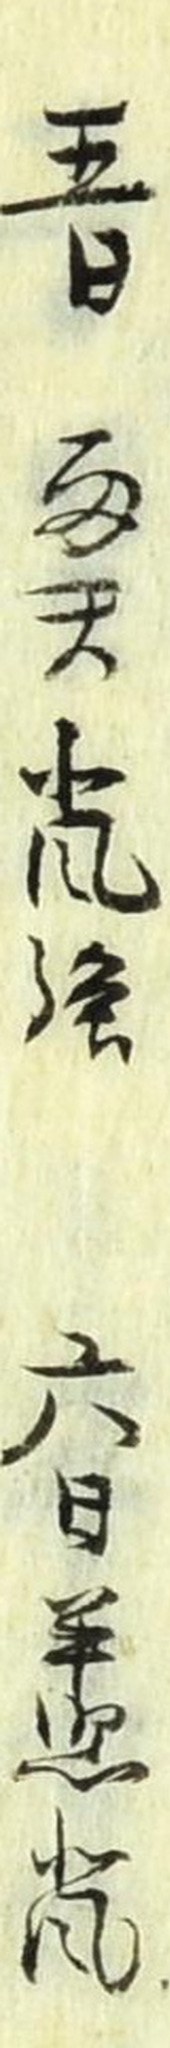五日雨天北風強六日半照北風
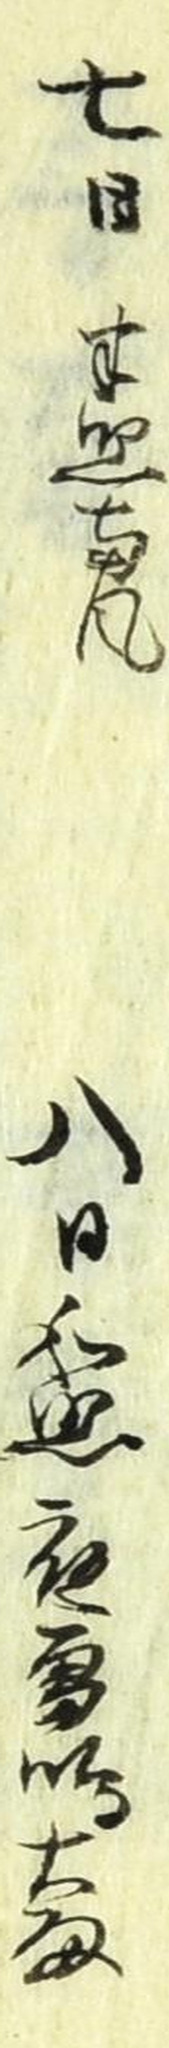七日半照南風八日和照夜雷鳴大雨
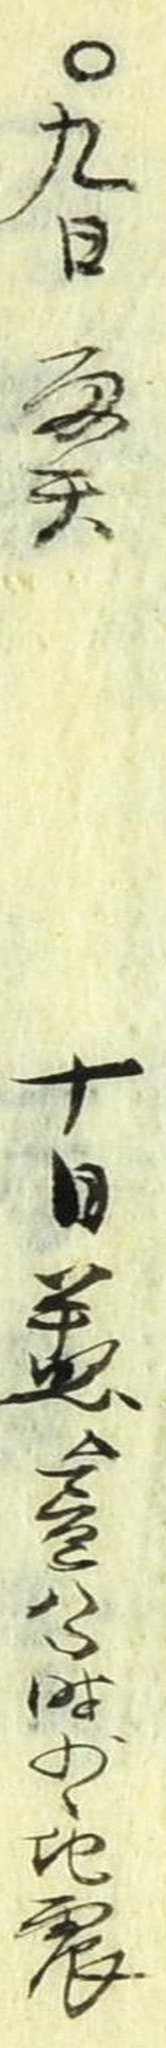○九日雨天十日半照△昼八ツ時少々地震
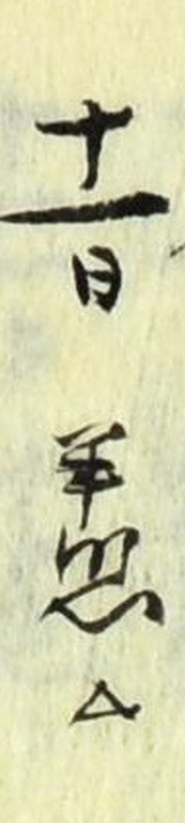十九日半照
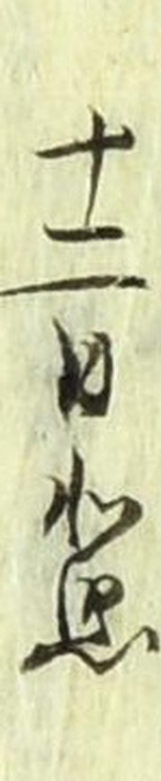十九日半照
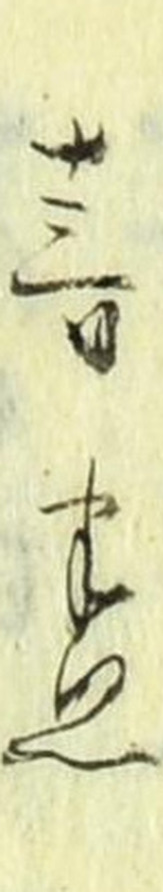十九日半照
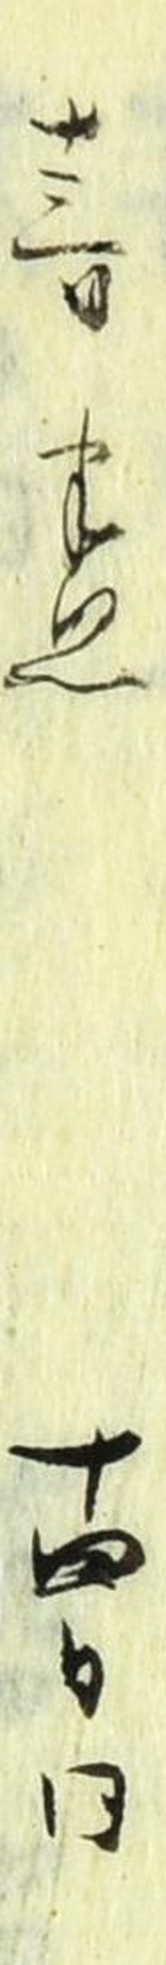十三日半照十四日同
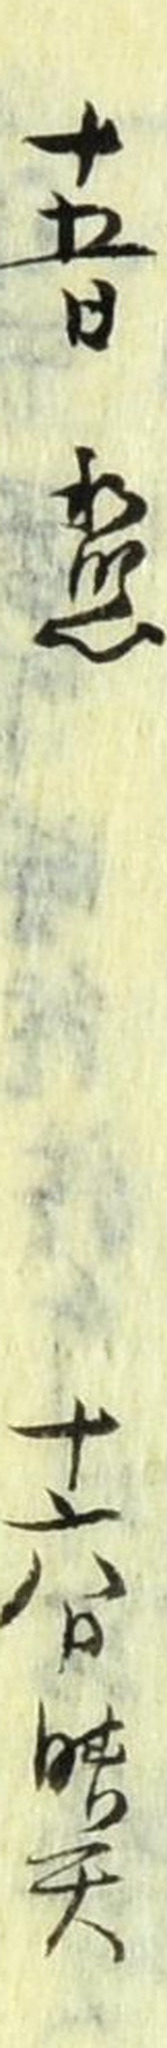十五日和照十六日晴天
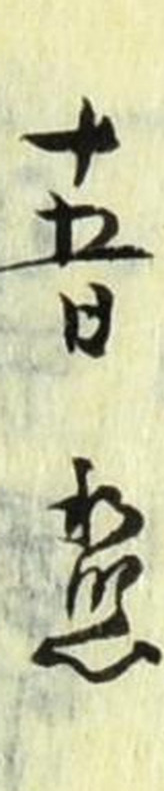十九日半照
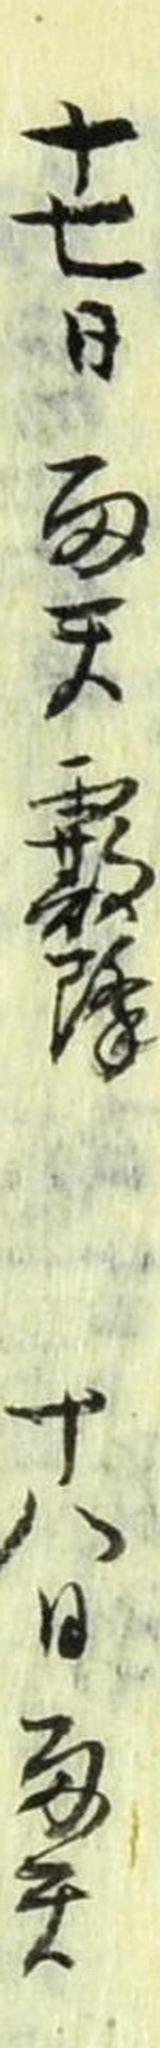十七日雨天霧降十八日雨天
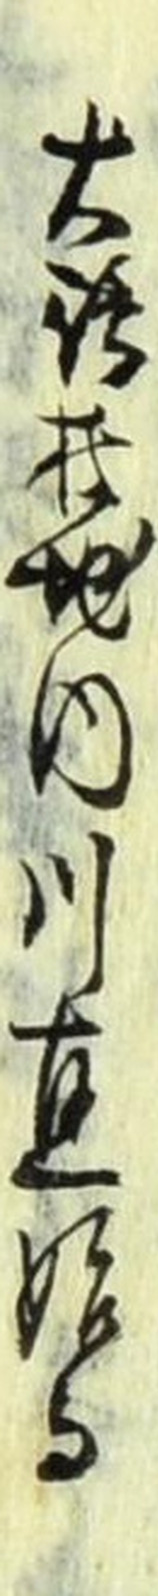大島村地内川直始る
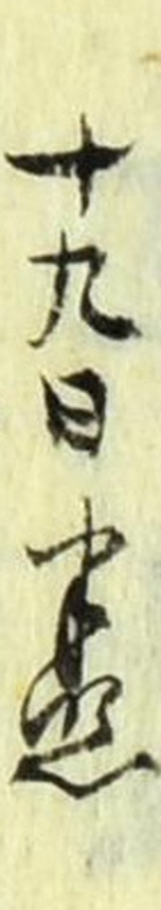十九日半照
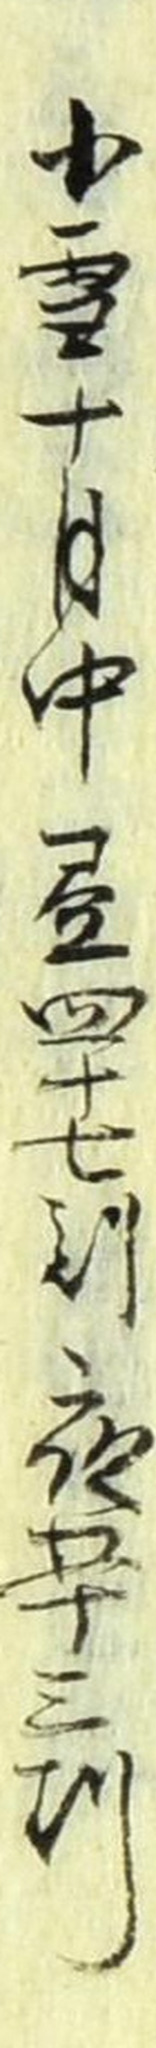小雪十月中昼四十七刻夜五十三刻
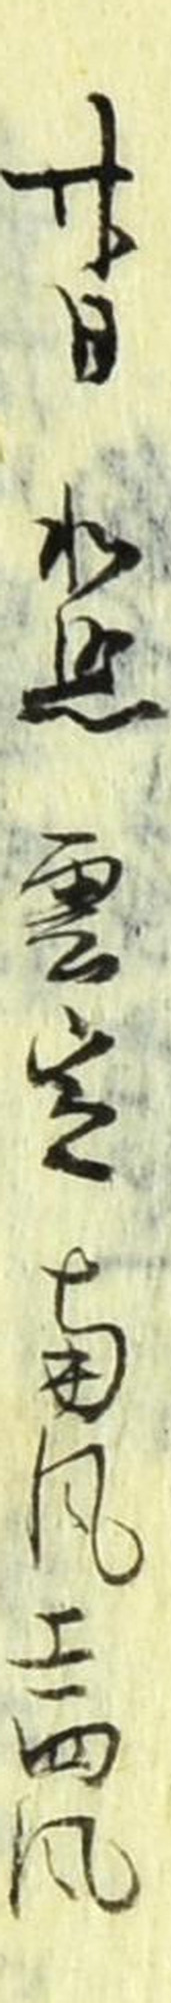廿日和照雲空南風上西風
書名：（日記）
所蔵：福井県文書館 Fukui Prefectural Archives
